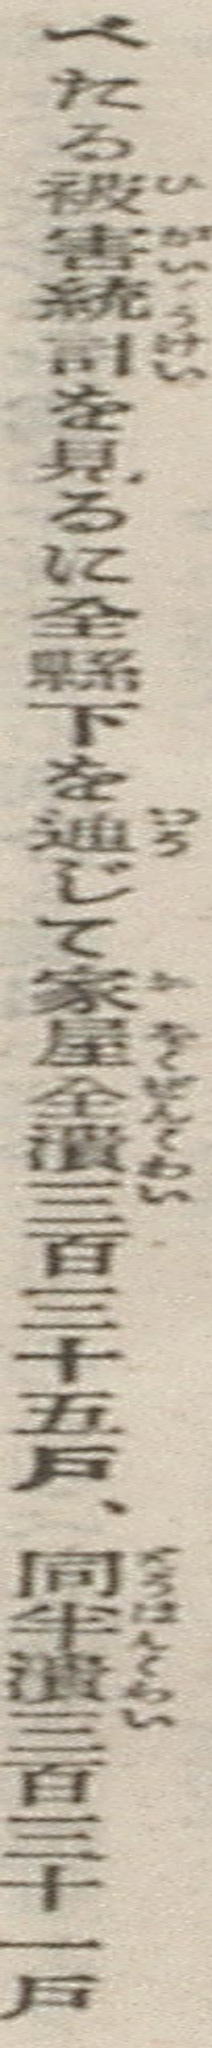べたる被害統計を見るに全縣下を通じて家屋全潰三百三十五戸、同半潰三百三十一戸
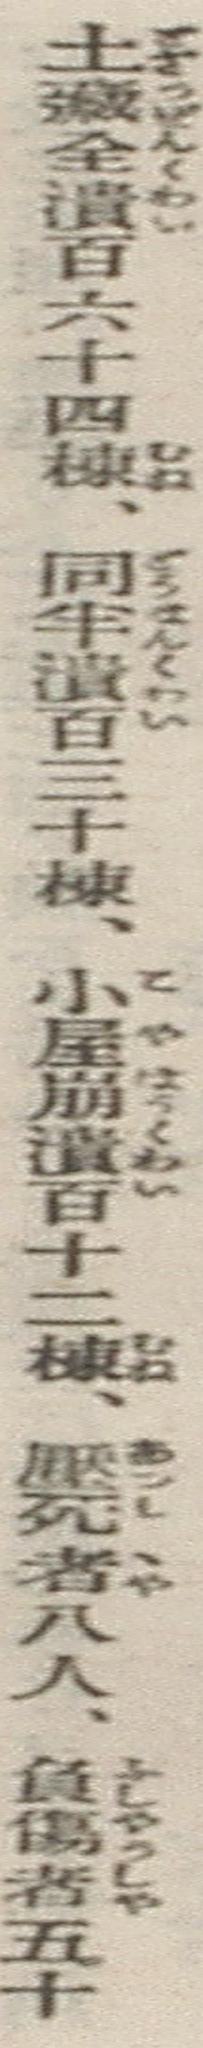土蔵全潰百六十四棟、同半潰百三十棟、小屋崩潰百十二棟、壓死者八人、負傷者五十
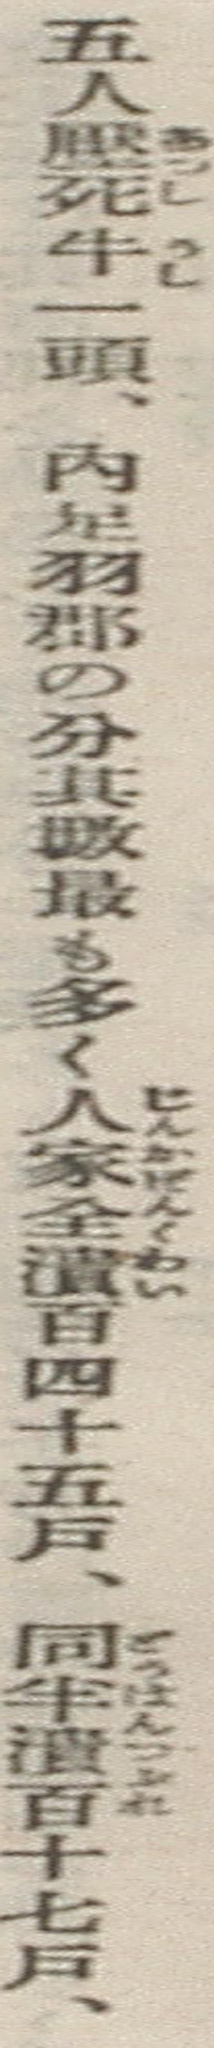五人壓死牛一頭、内足羽郡の分其数最多く人家全潰百四十五戸、同半潰百十七戸、
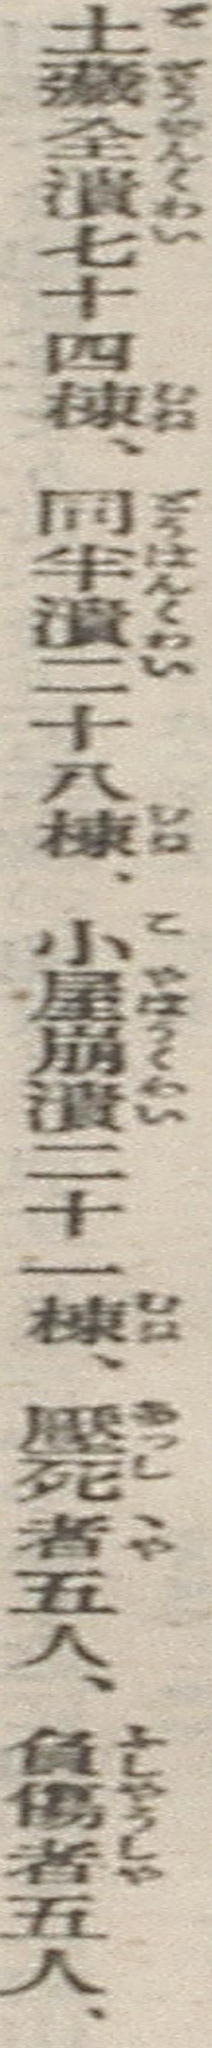土蔵全潰七十四棟、同半潰二十八棟、小屋崩潰二十一棟、壓死者五人負傷者五人、
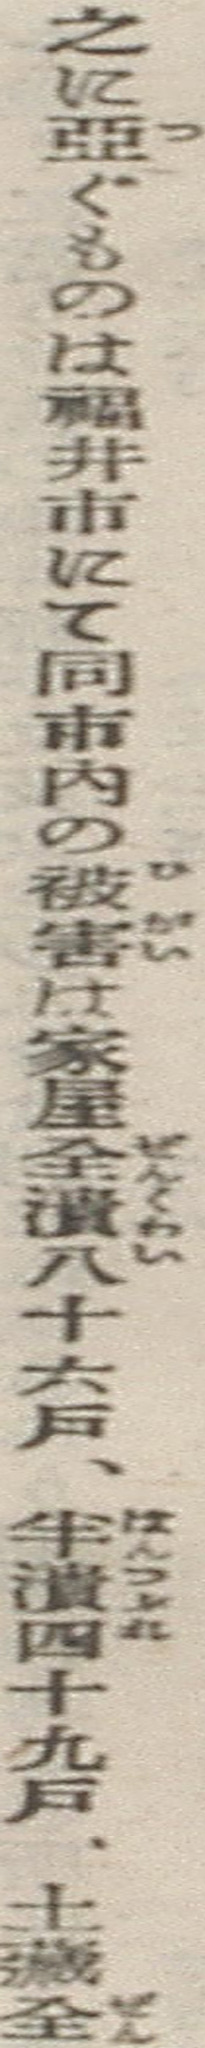之に亜ぐものは福井市にて同市内の被害は家屋全潰八十六戸半潰四十九戸、土蔵全
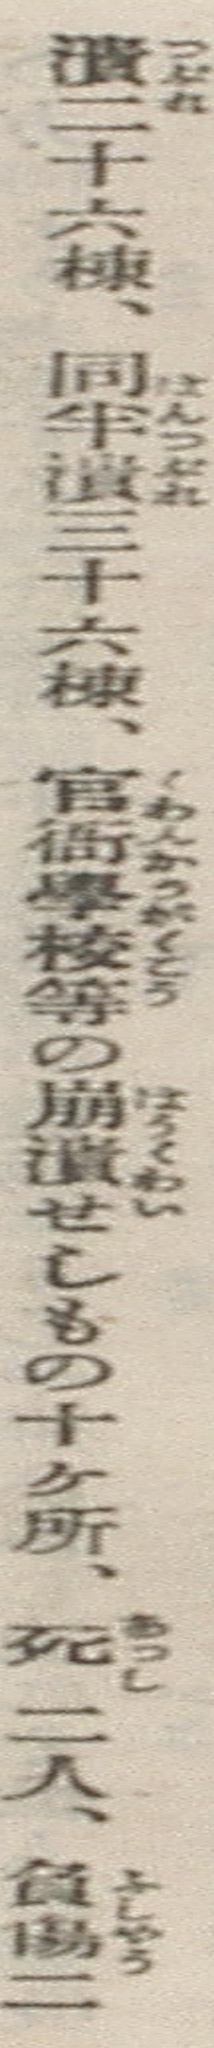潰二十六棟、同半潰三十六棟、官衙學校等の崩潰せしもの十ヶ所、死二人、負傷二
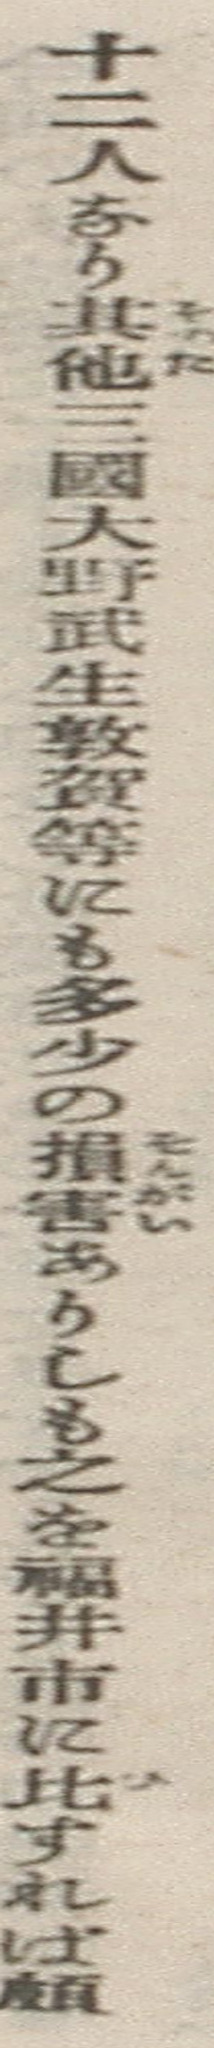十二人なり其他三國大野武生敦賀等にも多少の損害ありしも之を福井市に比すれば頗
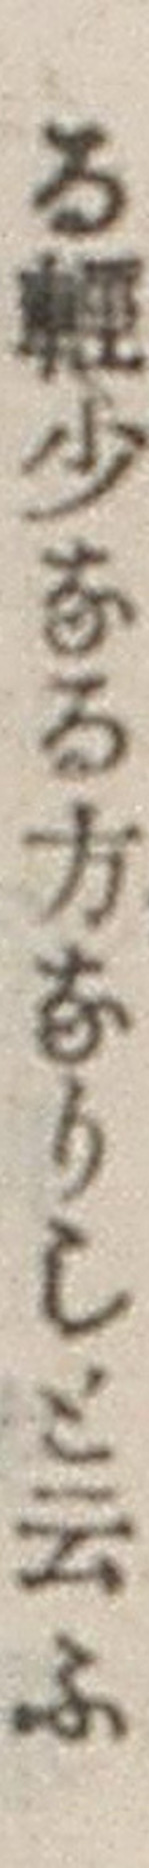る輕少なる方なりしと云ふ
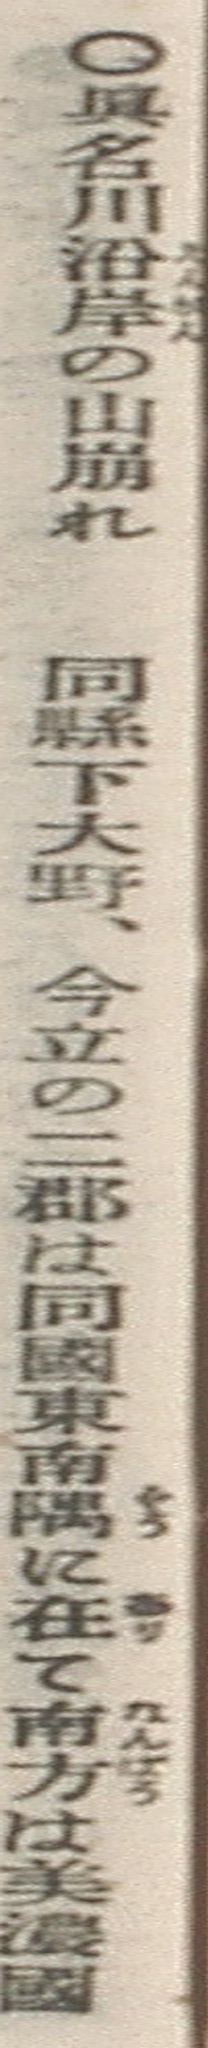○真名川沿岸の山崩れ同縣大野、今立の二郡は同國東南隅に在て南方は美濃國
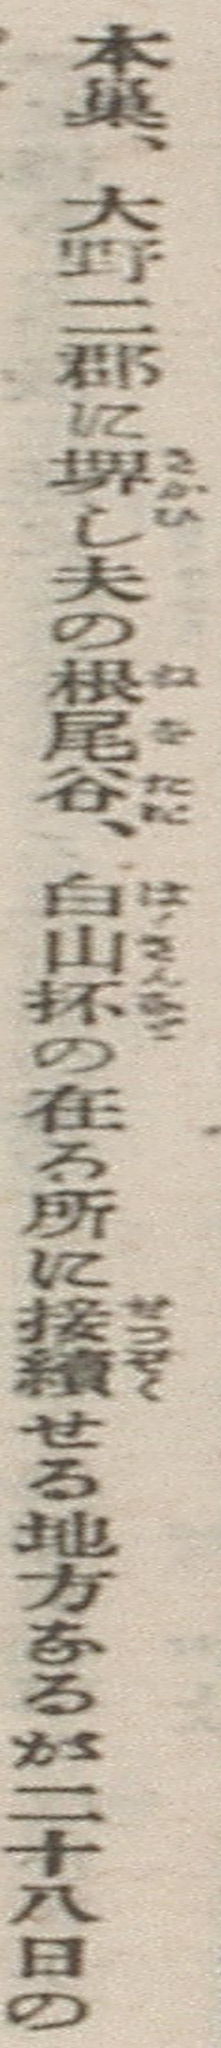本巣、大野二郡に堺し夫の根尾谷、白山抔の在る所に接続せる地方なるが二十八日の
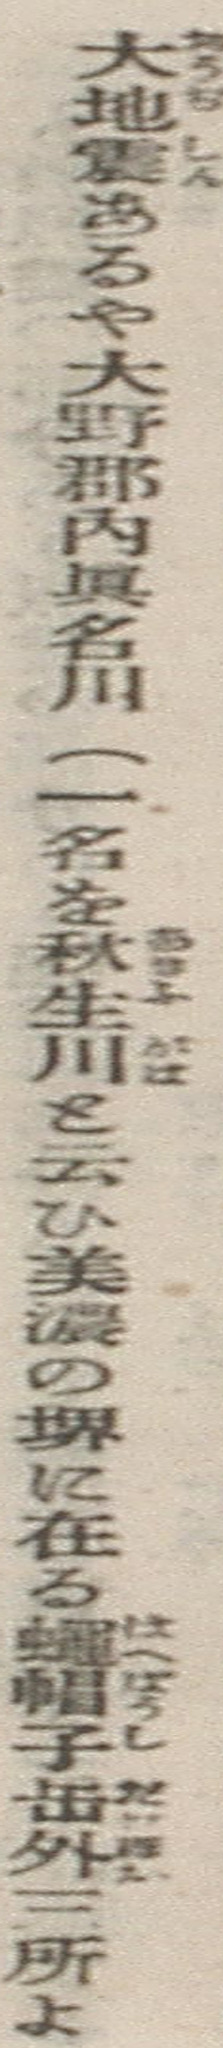大地震あるや大野郡内真名川と云ひ美濃の堺に在る蠅帽子岳外三所よ
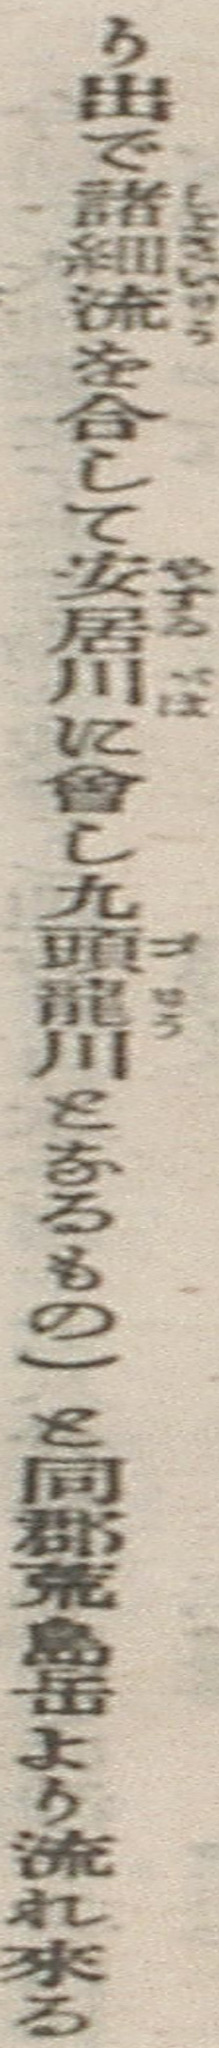り出で諸細流を合して安居川に會し九頭竜川となるもの）と同郡荒島岳より流来る
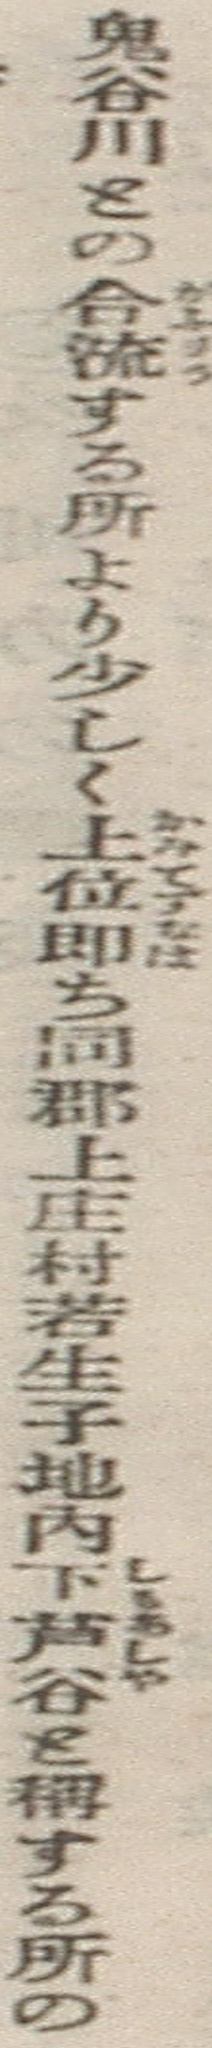鬼谷川との合流する所より少しく上位即ち同郡上庄村若生子地内下芦谷と称する所の
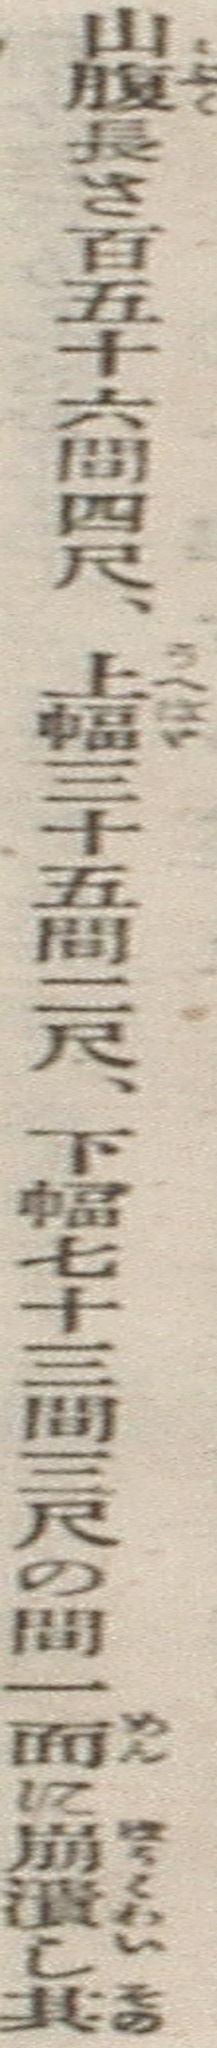山腹長さ百五十六間四尺、上幅三十五間二尺、下幅七十三間三尺の間一面に崩潰し其
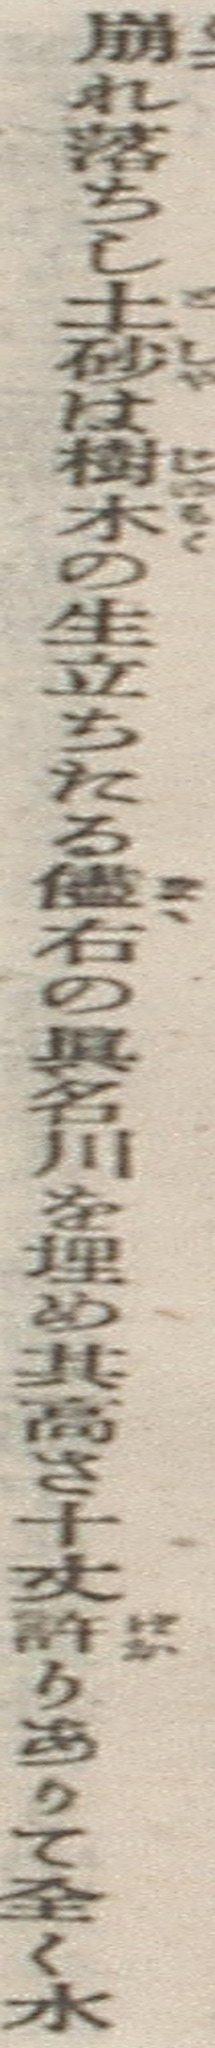崩れ落ちし土砂は樹木の生立ちたる儘右の真名川を埋め其高さ十丈計りありて全く水
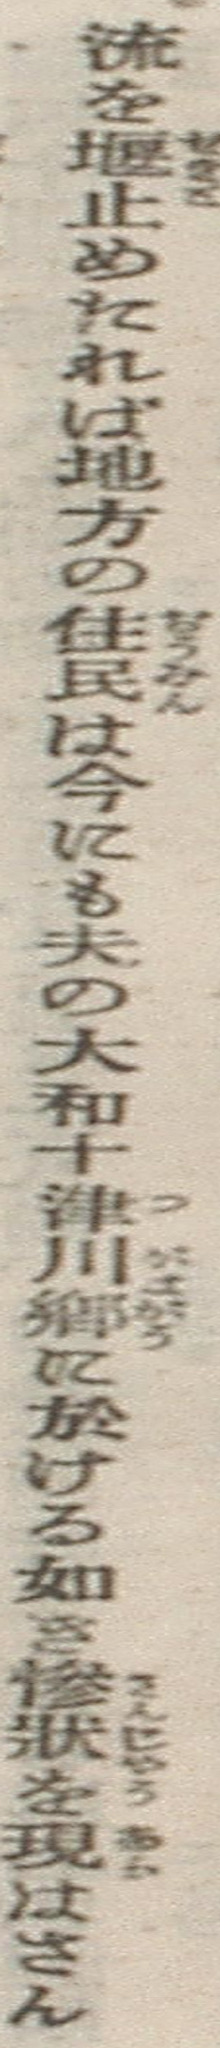流を堰止めたれば地方の住民は今にも夫の大和十津川郷に於ける如き惨状を現はさん
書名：愛知岐阜福井三県　大地震見聞録（内題）
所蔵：東京大学地震研究所図書室 Earthquake Research Institute Library, The University of Tokyo, JAPAN
